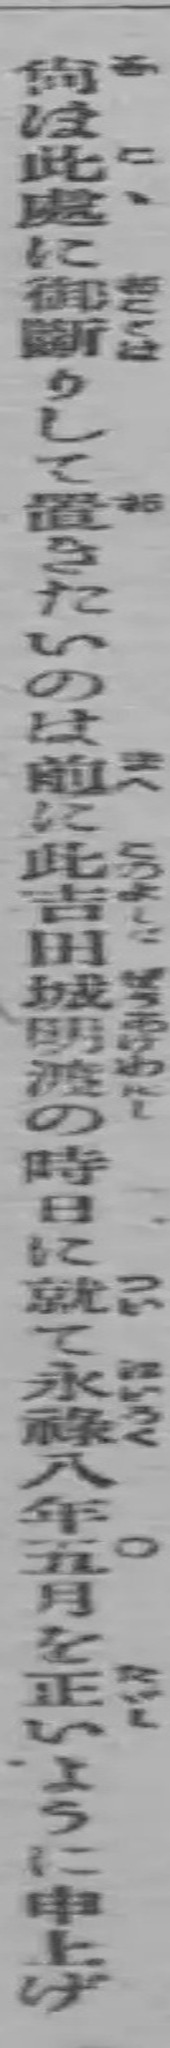尚ほ此処に御断りして置きたいのは前に此吉田城明渡の時日に就て永禄八年五月を正いように申上げ
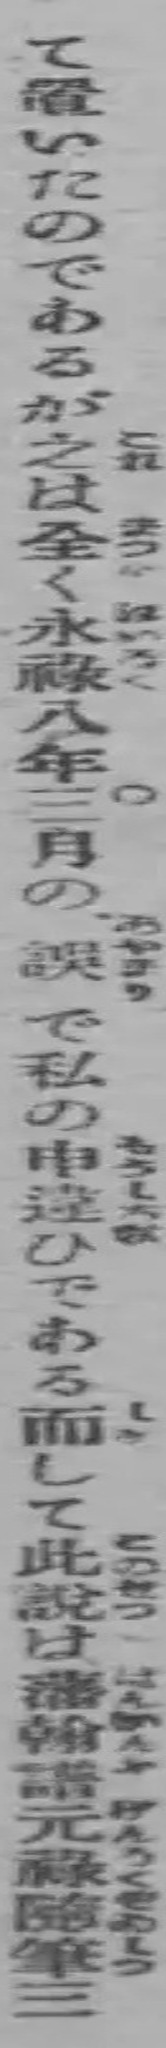て置いたのであるが之は全く永禄八年三月の誤で私の申違ひである而して此説は藩翰譜元禄随筆三
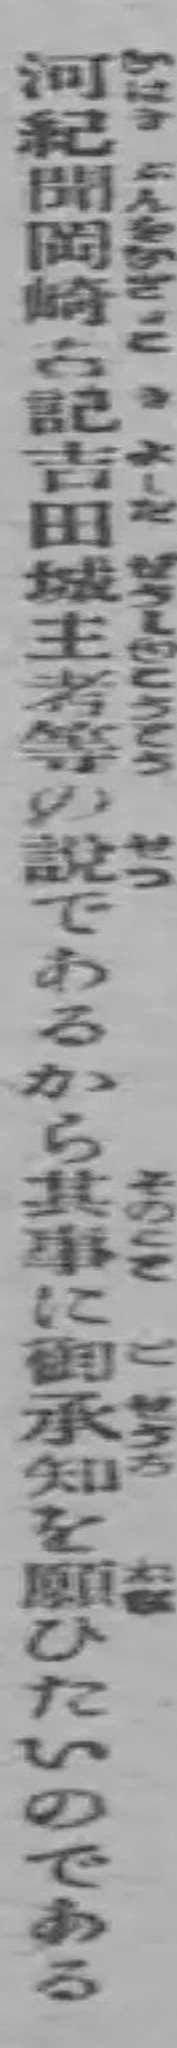河紀聞岡崎古記吉田城主考等の説であるから其事に御承知を願ひたいのである

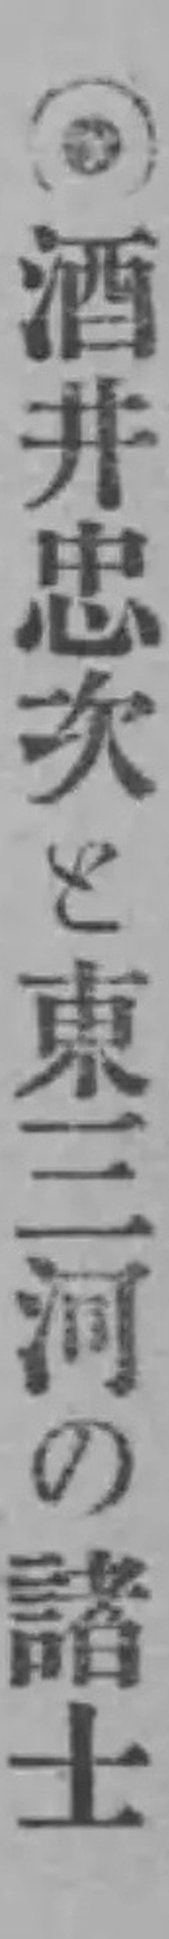◉酒井忠次と東三河の諸士
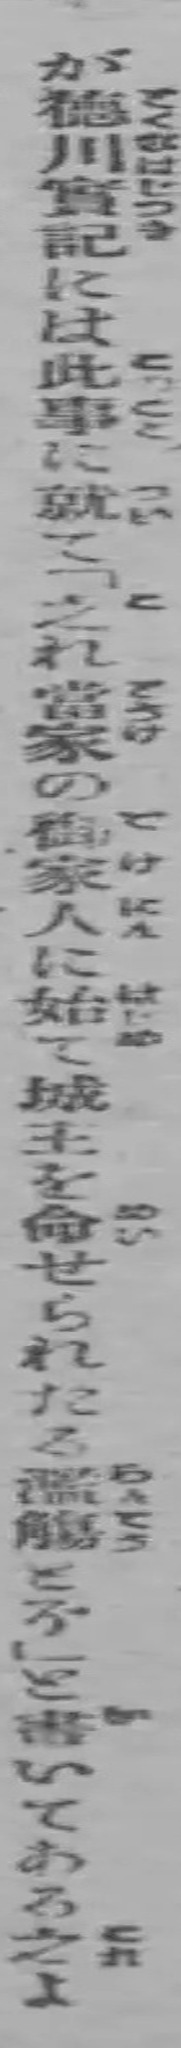ぜし濫觴が徳川実記には此事に就て「之れ当家の御家人に始て城主を命ぜられたる濫觴とぞ」と書いてある之よ
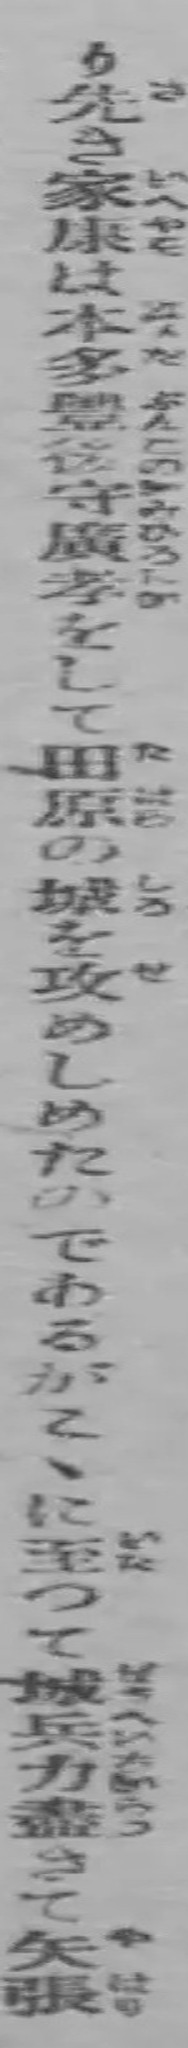本多広孝り先き家康は本多豊後守広孝をして田原の城を攻めしめたのであるがこゝに至つて城兵力尽きて矢張
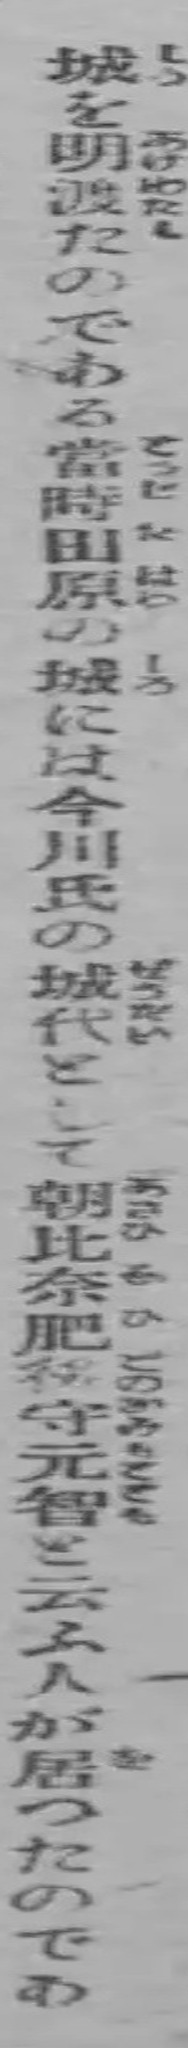城を明渡たのである当時田原の城には今川氏の城代として朝比奈肥後守元智と云ふ人が居つたのであ
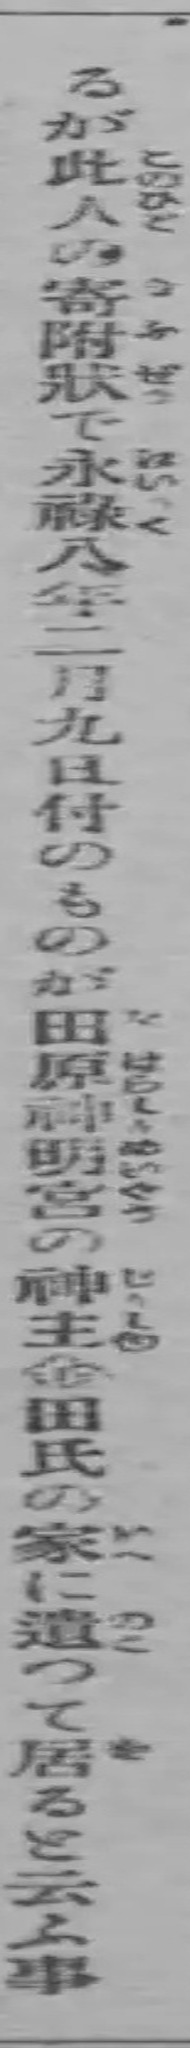るが此人の寄附状で永禄八年二月九日付のものが田原神明宮の神主金田氏の家に遺つて居ると云ふ事
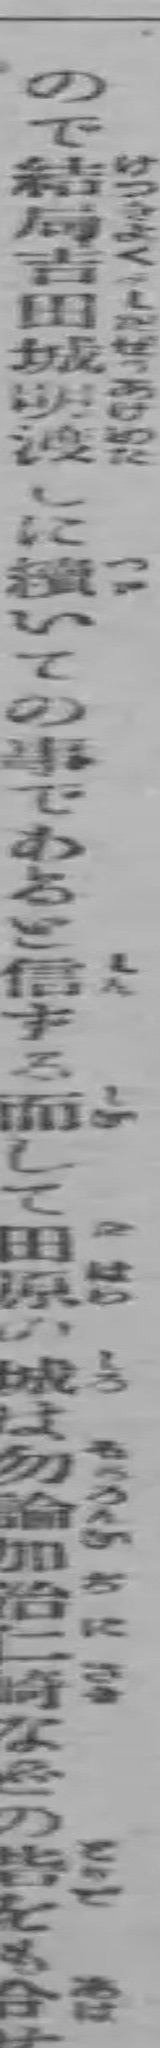ので結局田原城明渡しに続いての事であると信ずる而して田原の城は勿論加治仁崎などの砦をも合せ
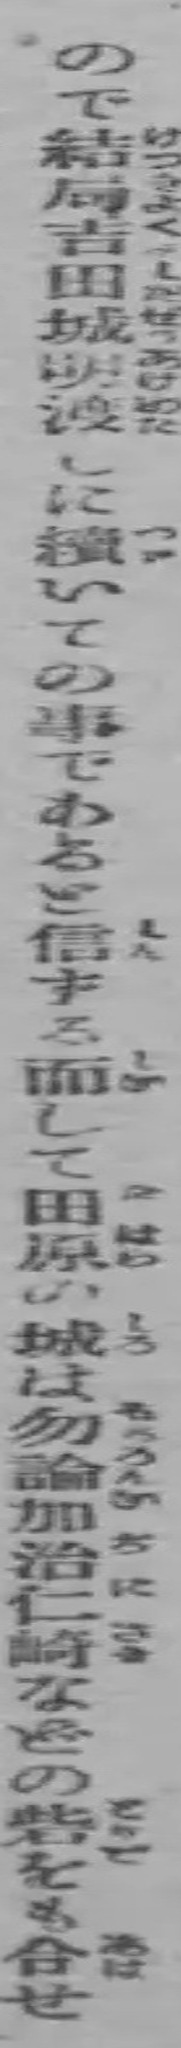ので結局田原城明渡しに続いての事であると信ずる而して田原の城は勿論加治仁崎などの砦をも合せ
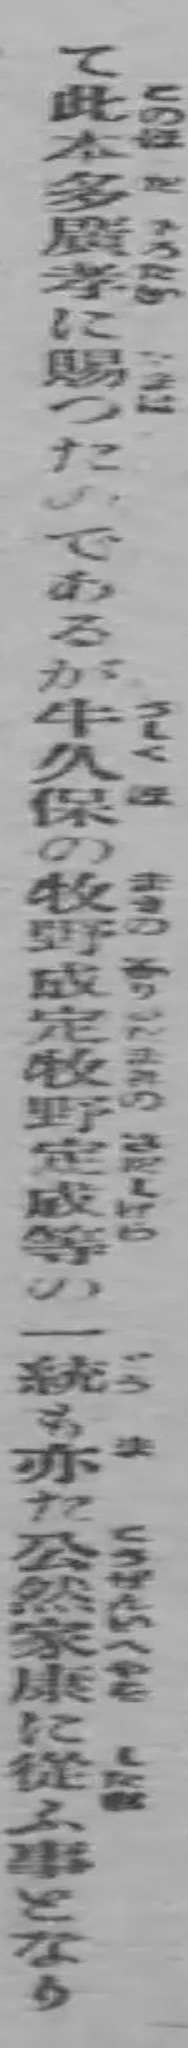て此本多広孝に賜つたのであるが牛久保の牧野成定牧野定成等の一統も亦た公然家康に従ふ事となり
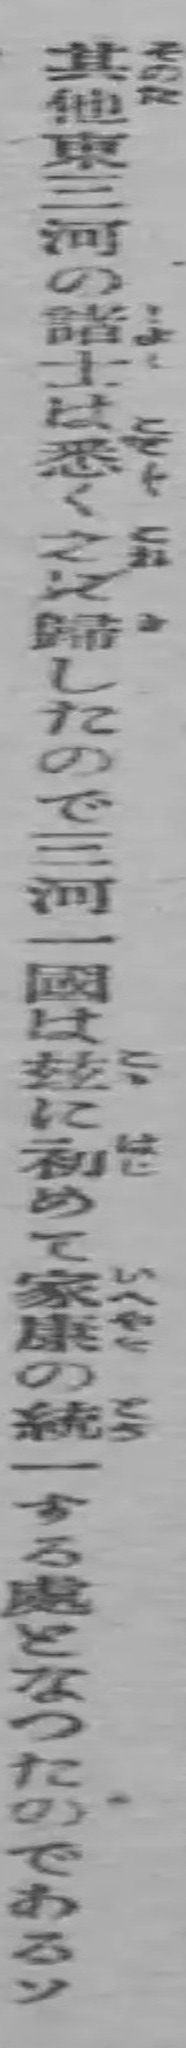其他東三河の諸士は悉く之に帰したので三河一国は茲に初めて家康の統一する処となつたのであるソ
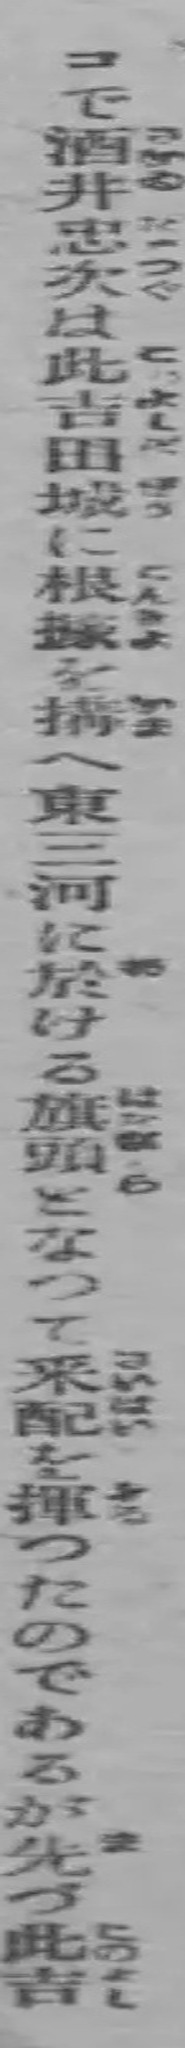コで酒井忠次は此吉田城に根拠を搆へ東三河に於ける旗頭となつて采配を揮つたのであるが先づ此吉
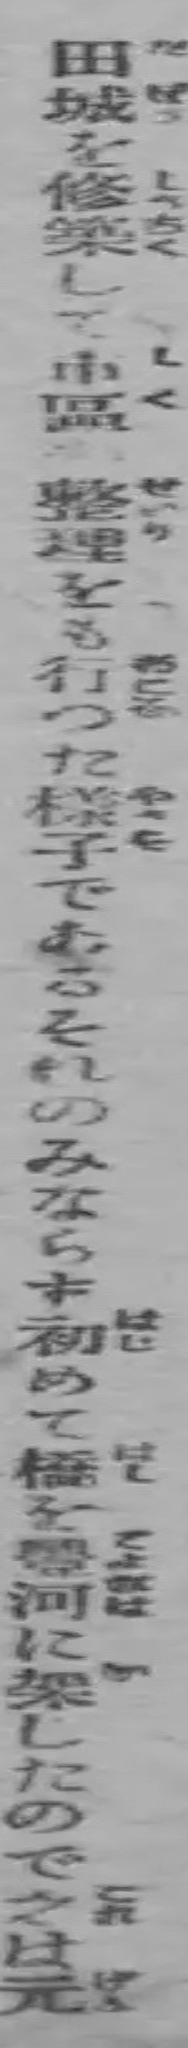豊河の架橋田城を修築して市区の整理をも行つた様子であるそれのみならず初めて橋を豊河に架したので之は元
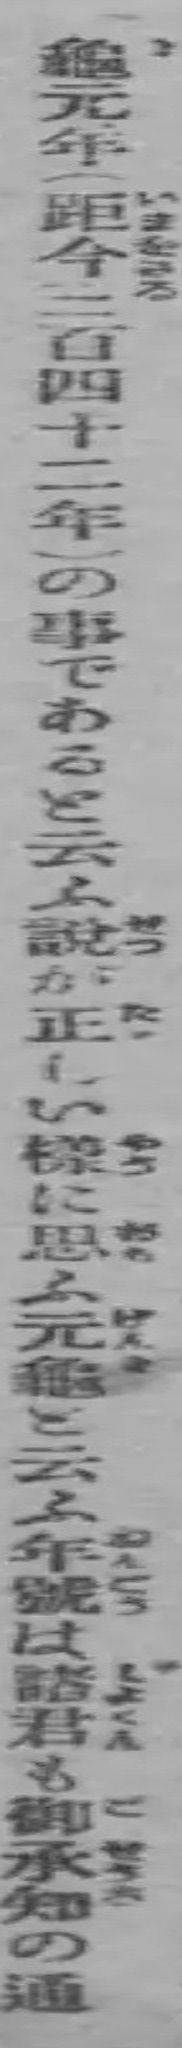亀元年(距去三百四十二年)の事であると云ふ説が正しい様に思ふ元亀と云ふ年号は諸君も御承知の通
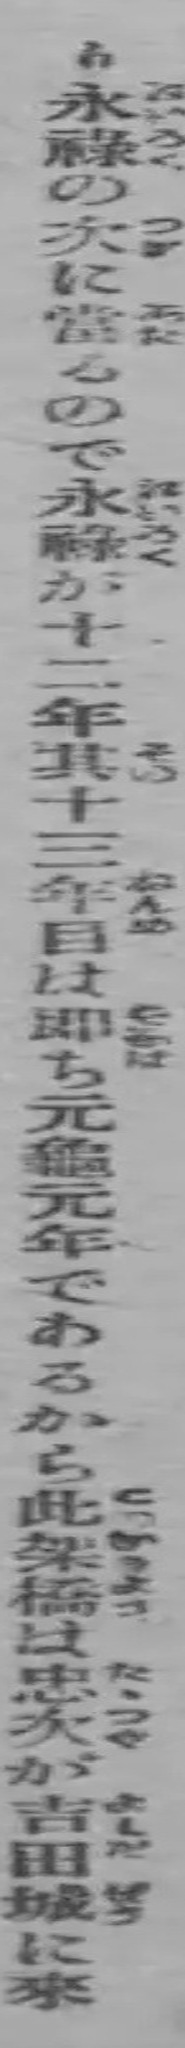り永禄の次に当るので永禄が十二年其十三年目は即ち元亀元年であるから此架橋は忠次が吉田城に来
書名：豊橋市史談
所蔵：国立国会図書館 National Diet Library, JAPAN
